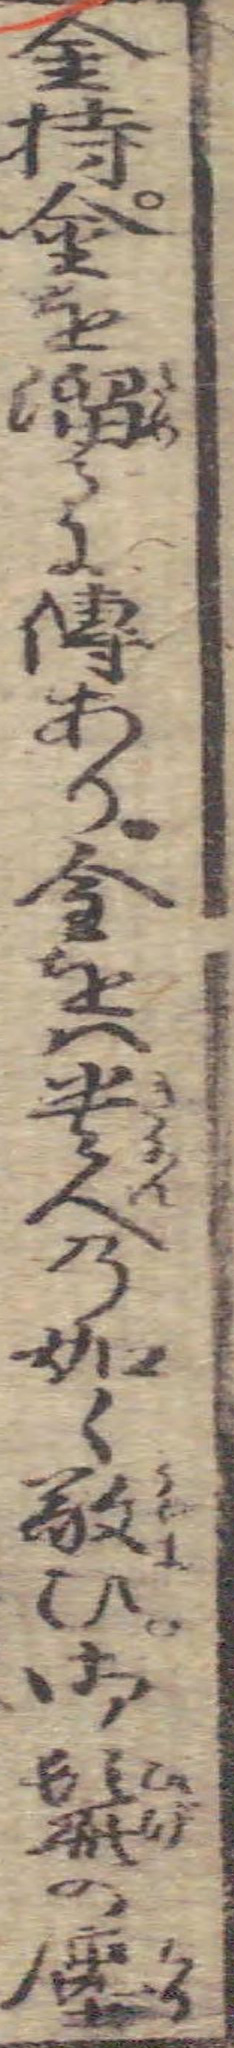金持。金を溜るに伝あり。金をは貴人の如く敬ひ。御髭の塵
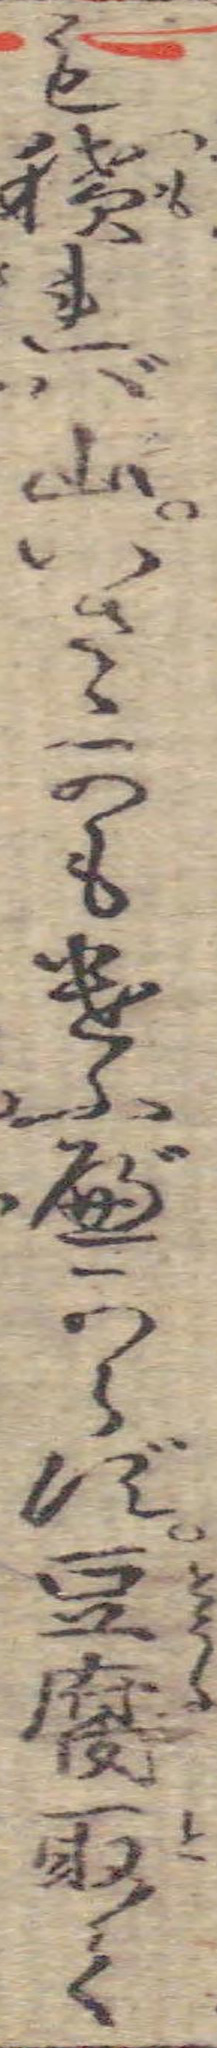も積れば山。いさゝかも遣ふべからず。豆腐取て
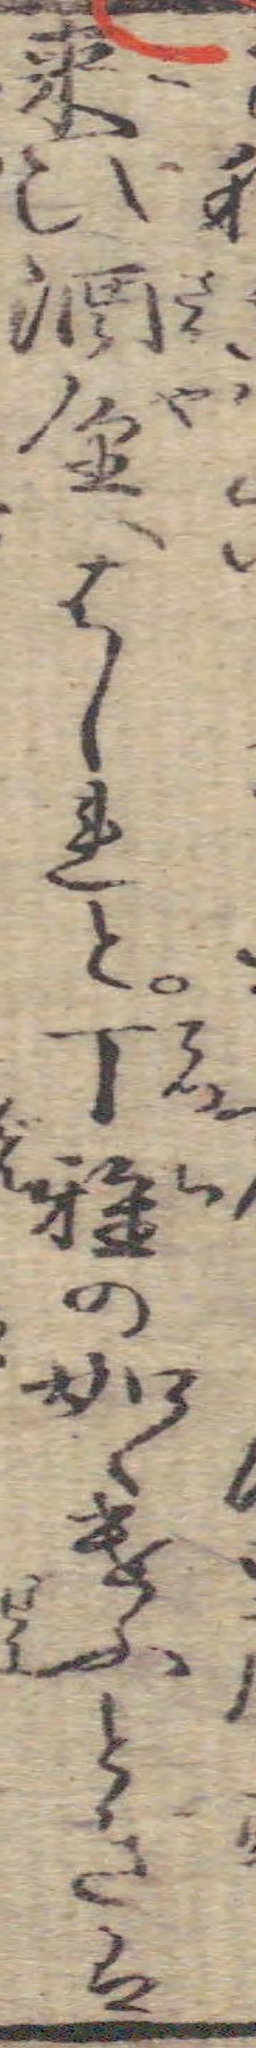来ひ酒屋へはしれと。丁稚の如く遣ふときは
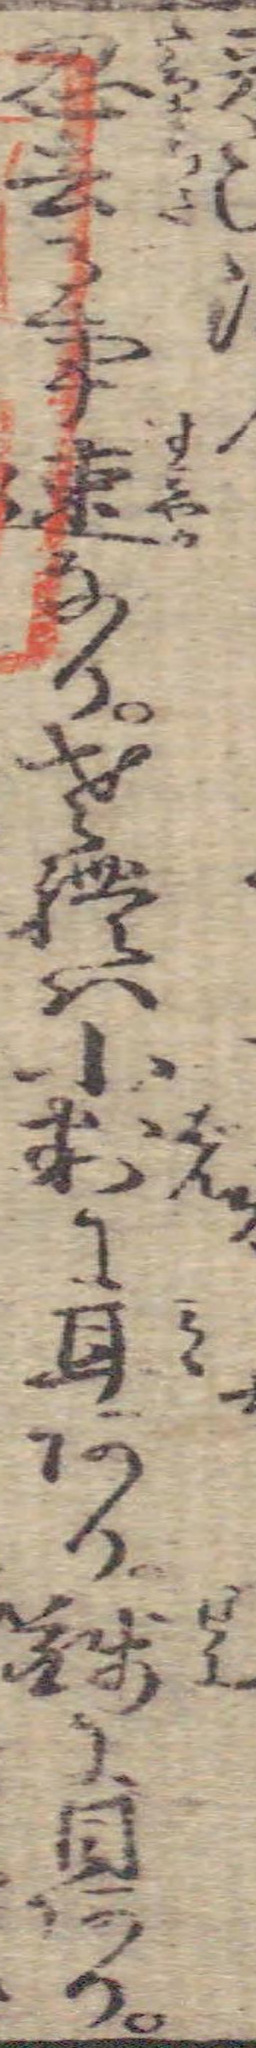忽去る事速なり。されは小判に耳あり。銭に目あり。
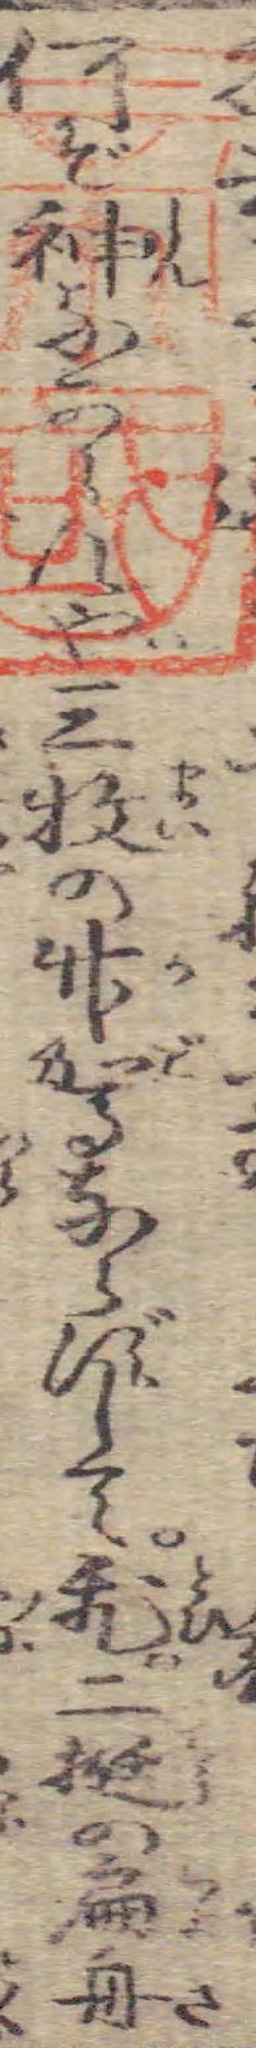何ぞ神なからんや三枚の竹駕ならずして。飛。二挺の扁舟
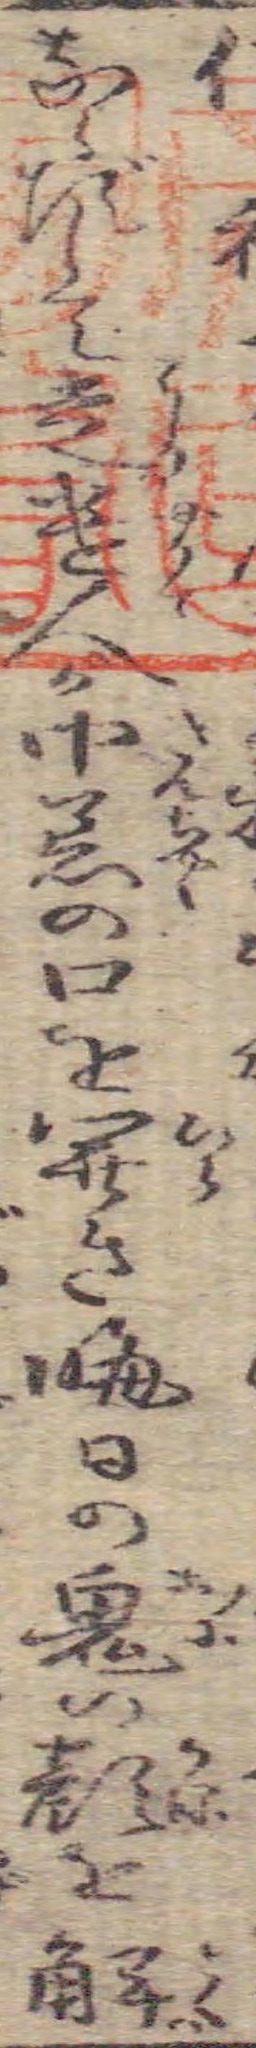ならずして走遣人が巾着の口を開き晦日の鬼の顔を解。
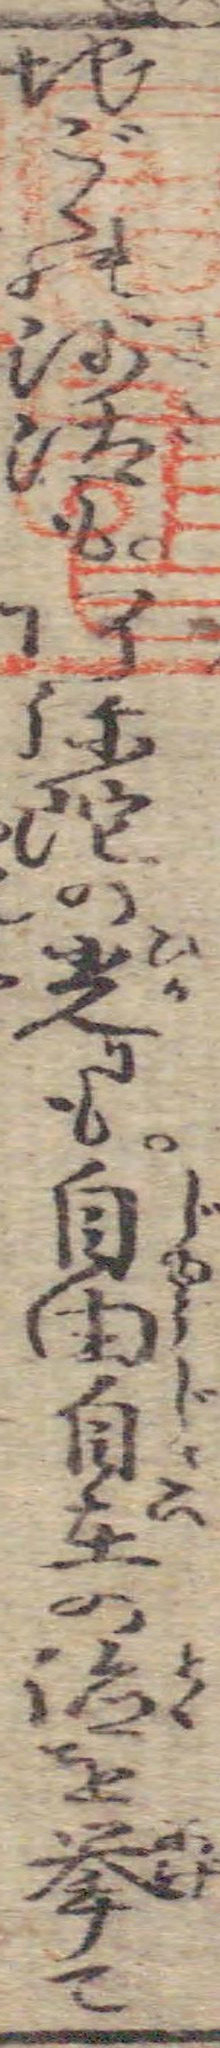地ごくの沙汰も。阿弥陀の光。自由自在の徳を挙て
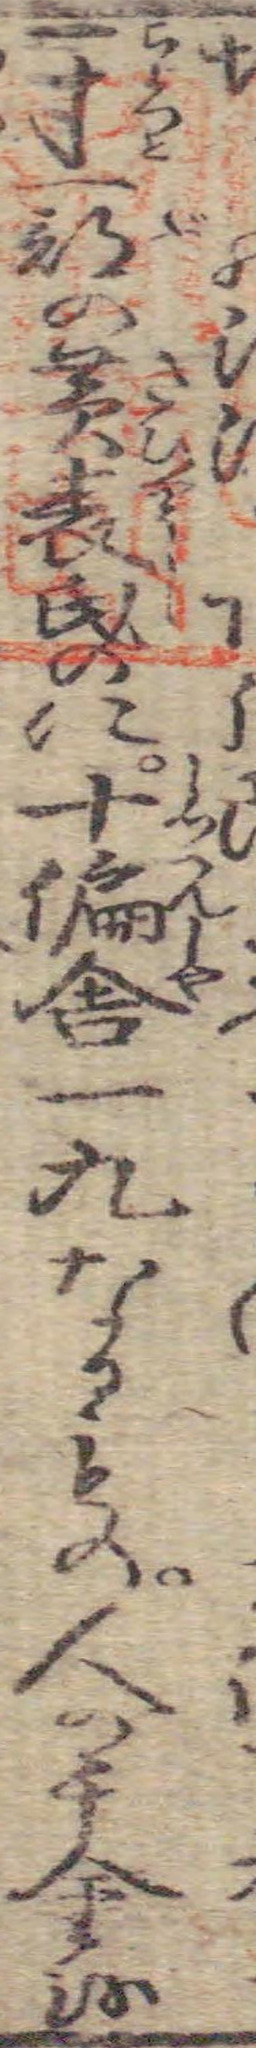一寸一部の黄表紙に。十偏舎一九なるもの。人の千金を
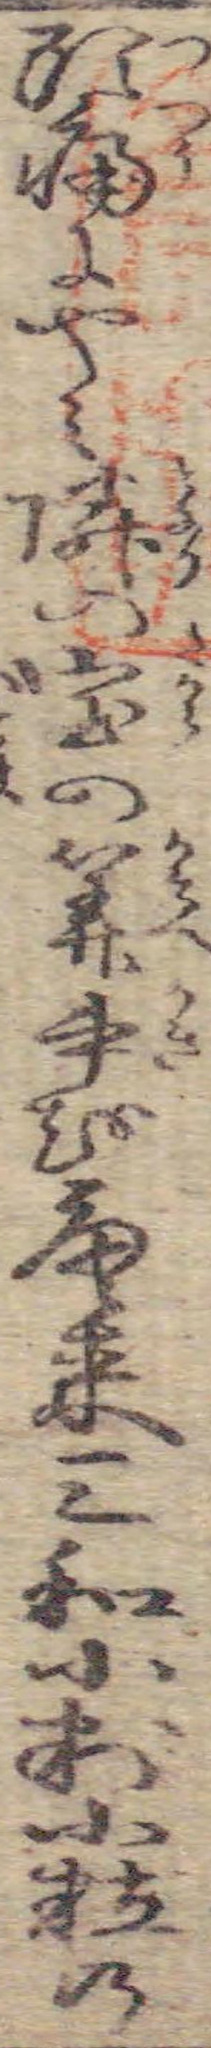頭痛にやみ隣の宝の算書を唐来三和小判小粒の
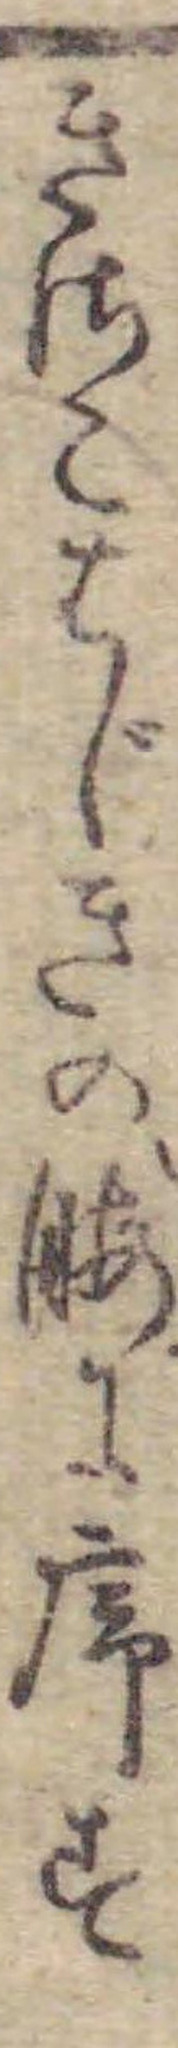きさこはじきの暇に序す
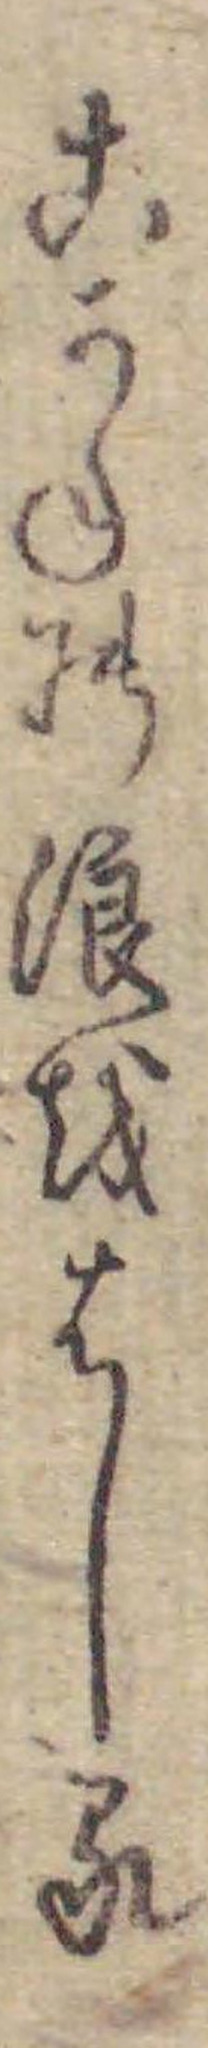こかねの浪をはしる
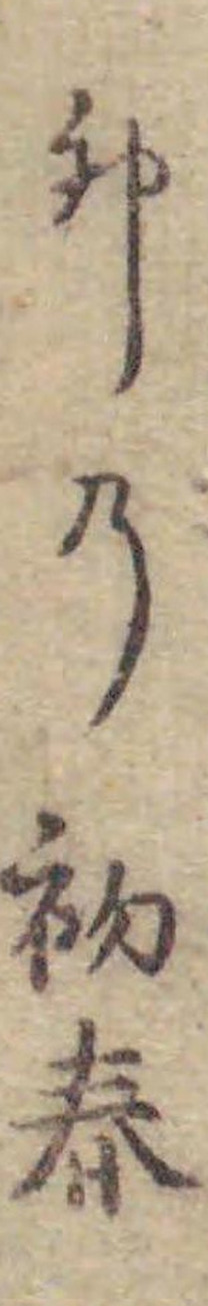卯の初春

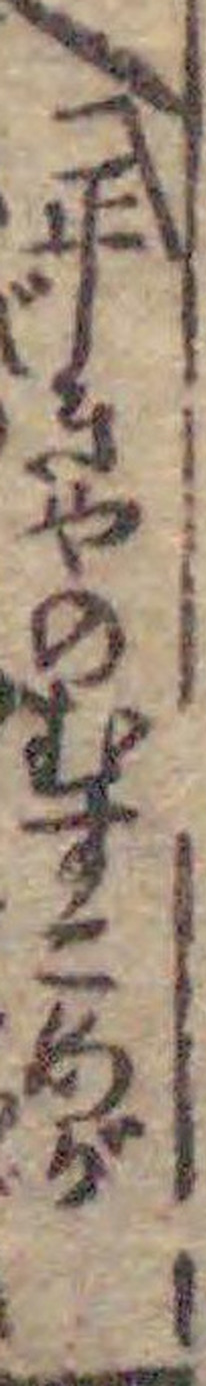〽正しきやのむすこめが
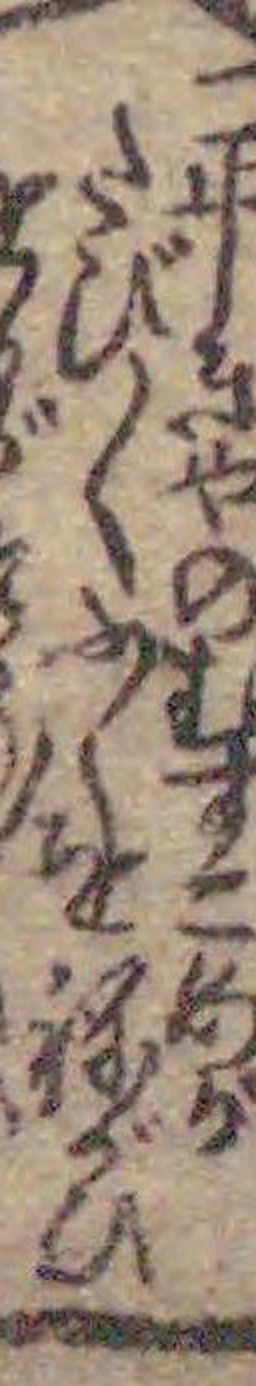たび〳〵ふくをねがひ
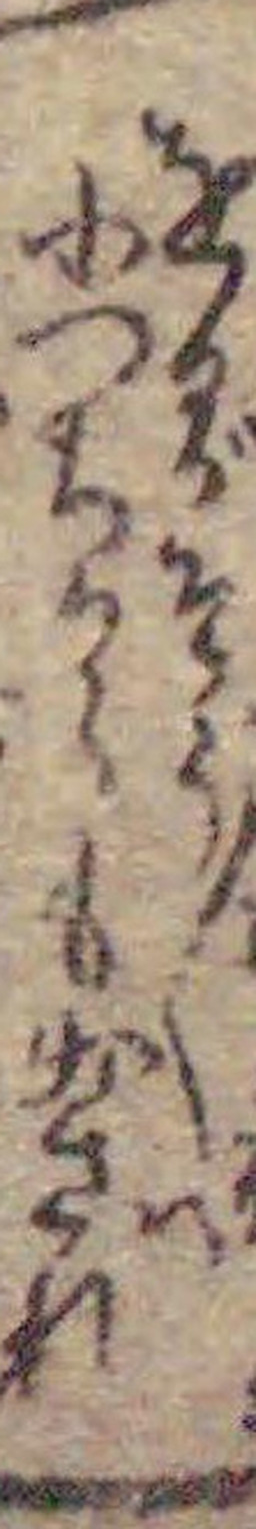小つちからも出され
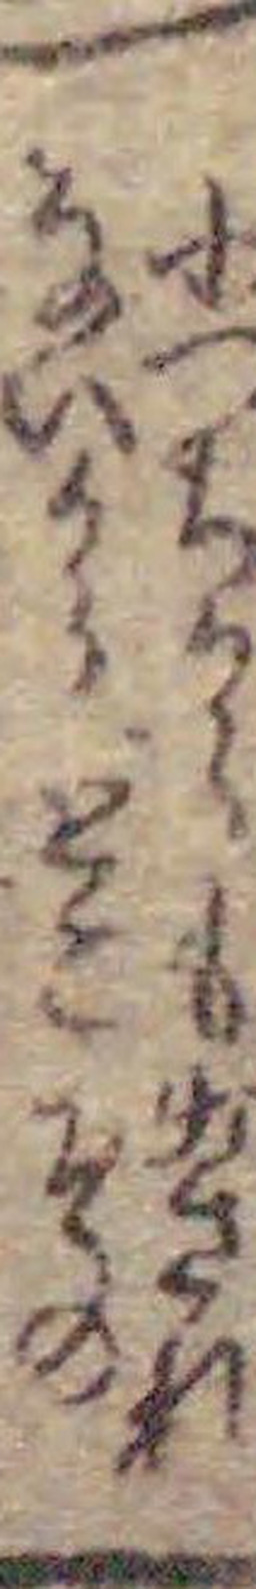ないからどこその
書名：新鋳小判 : 3巻
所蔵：国立国会図書館 National Diet Library, JAPAN
